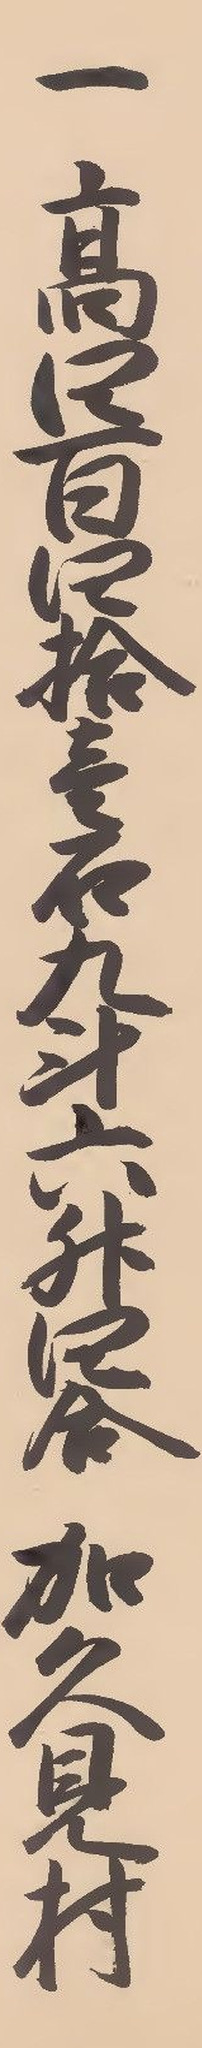一髙四百四拾壱石九斗六升四合加久見村
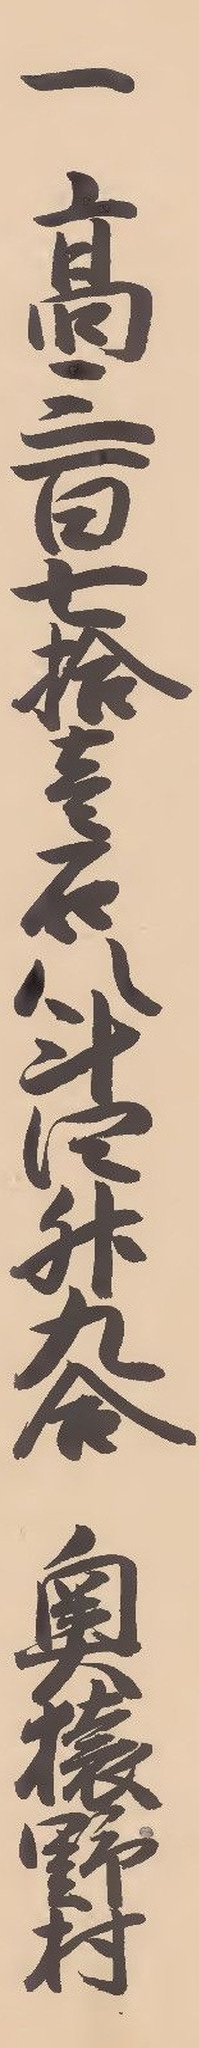一髙三百七拾壱石八斗四升九合奥猿野村
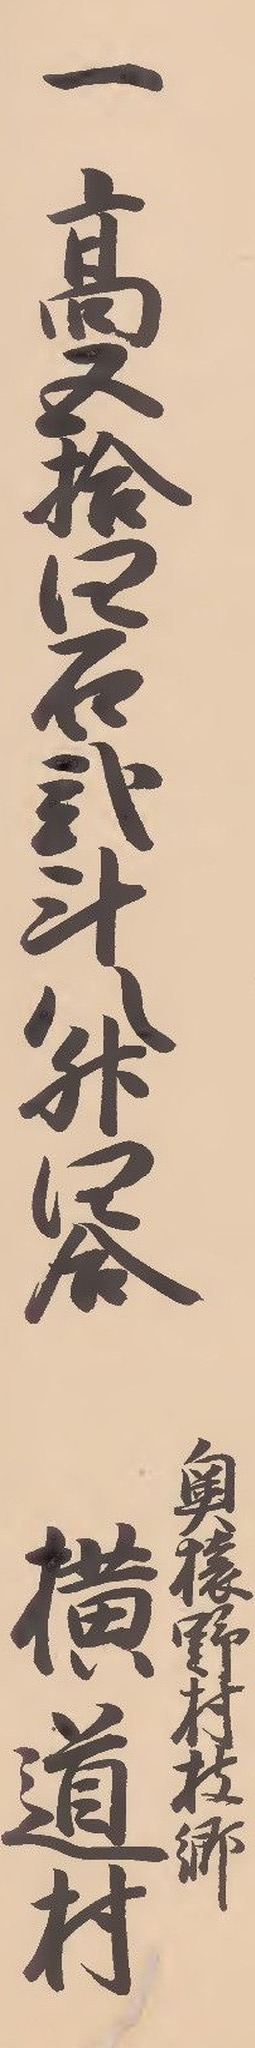一髙五拾四石弐斗八升四合横道村
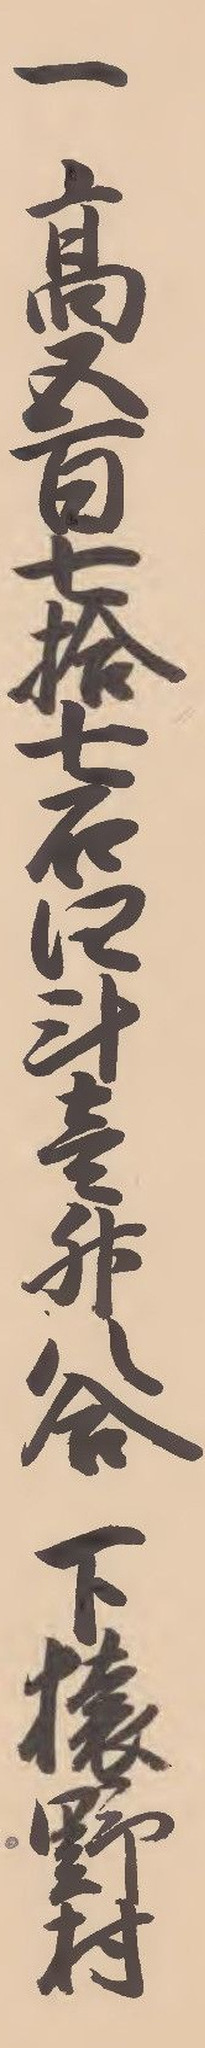一髙五百七拾七石四斗壱升八合下猿野村
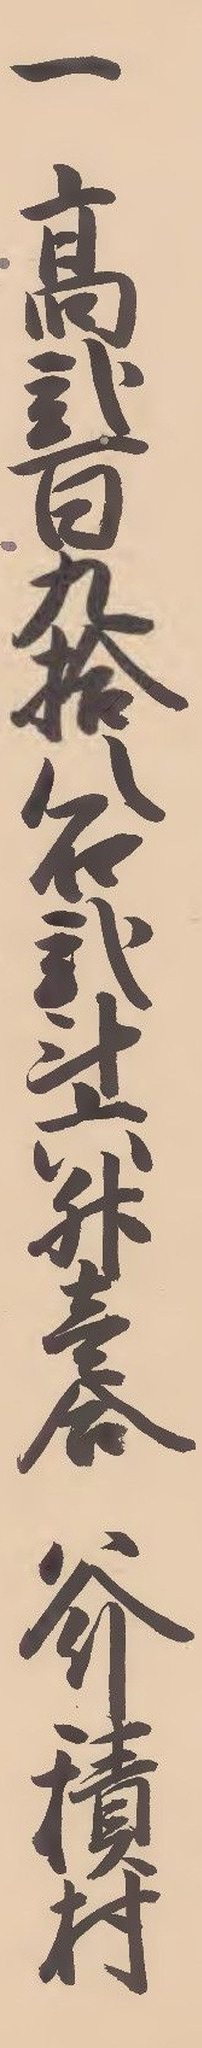一髙弐百九拾八石弐斗六升壱合斧積村

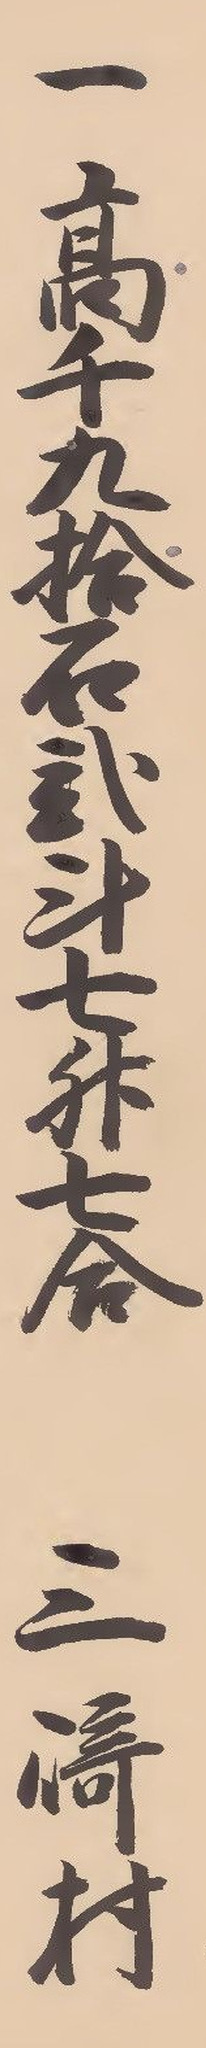一髙千九拾石弐斗七升七合三崎村
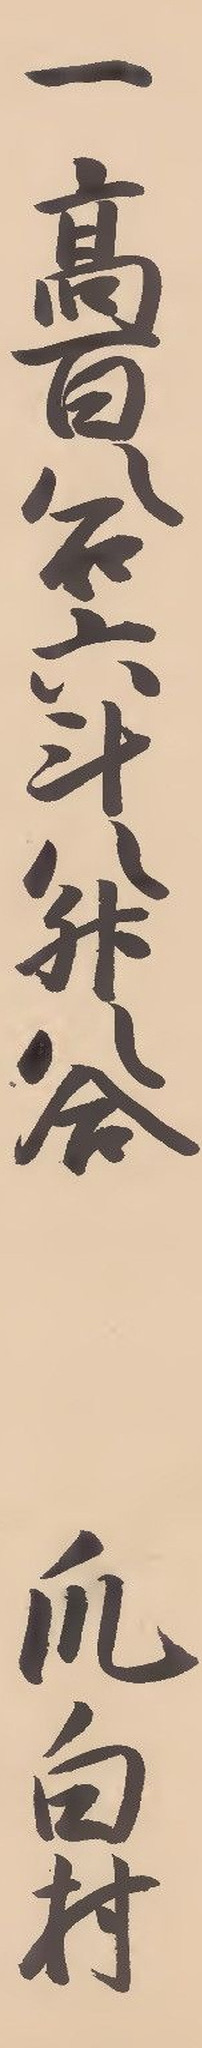一髙百八石六斗八升八合瓜白村
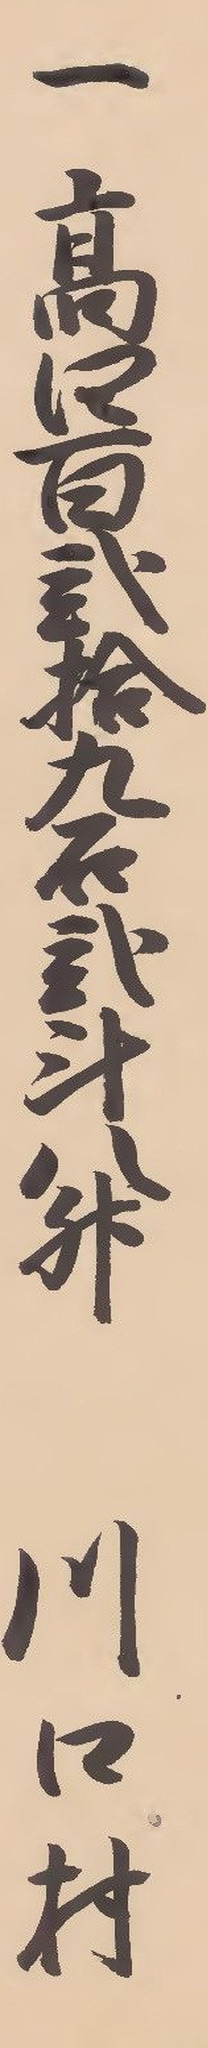一髙四百弐拾九石弐斗八升川口村
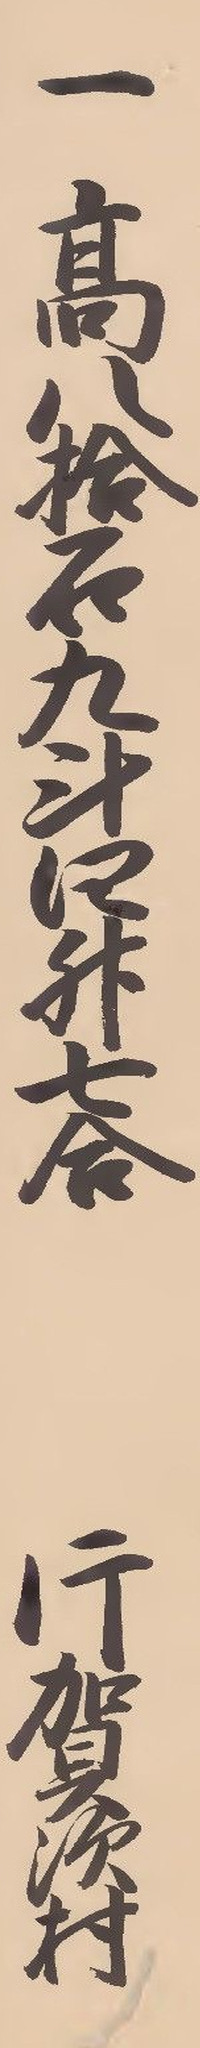一髙八拾石九斗四升七合行賀次村
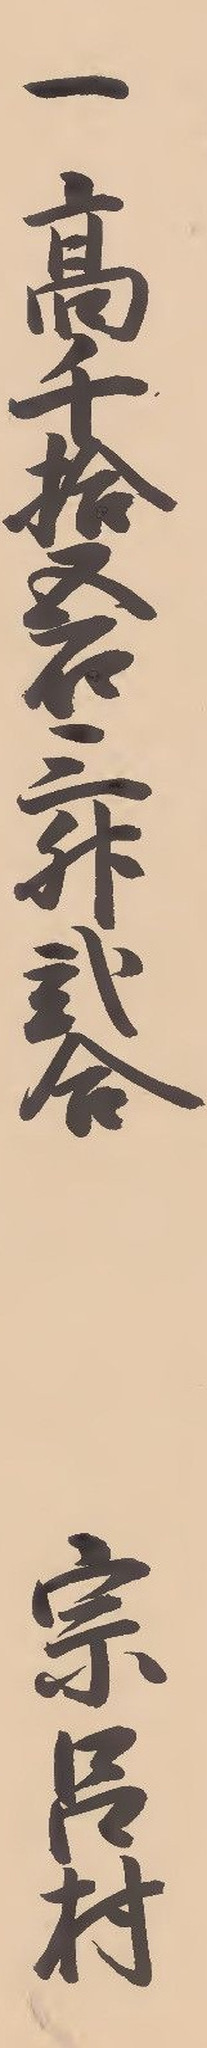一髙千拾五石三升弐合宗呂村
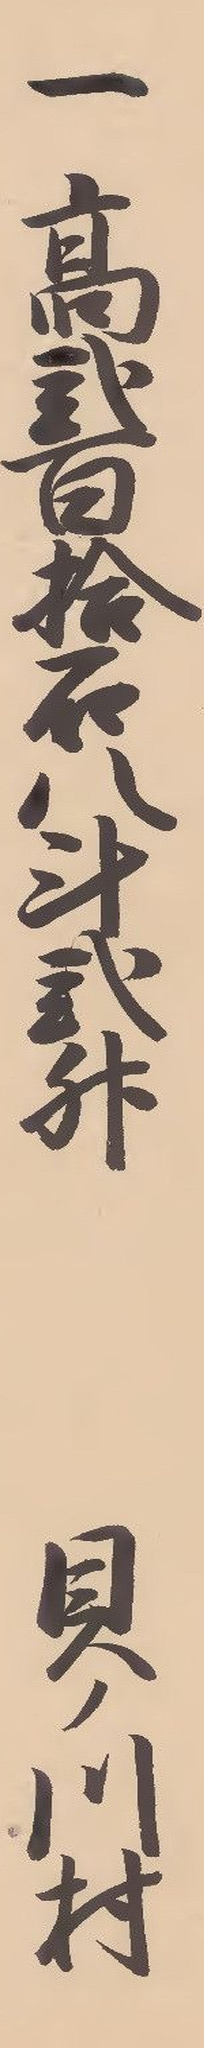一髙弐百拾石八斗弐升貝ノ川村
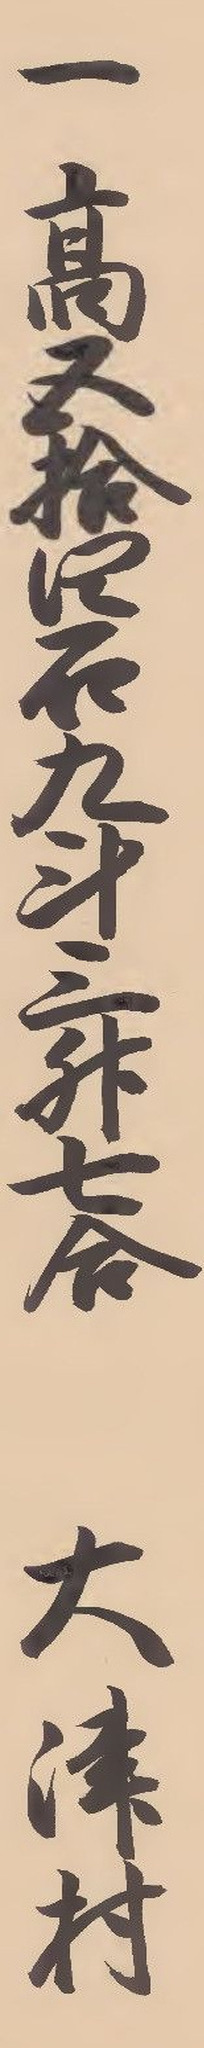一髙五拾四石九斗三升七合大津村
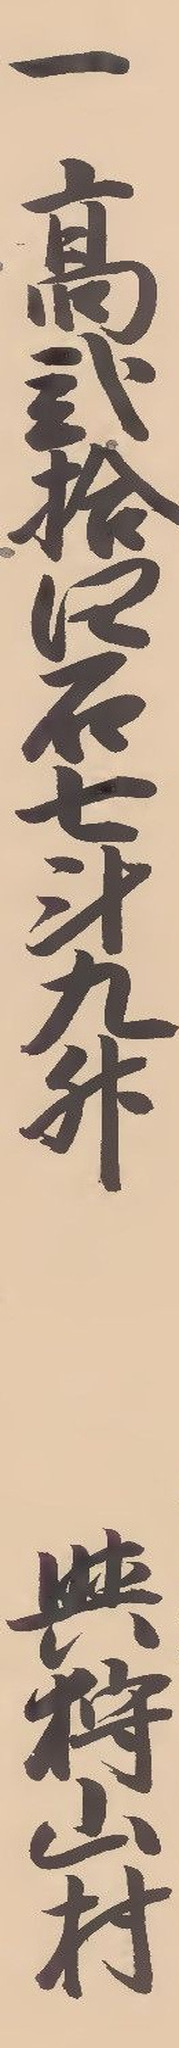一髙弐拾四石七斗九升輿狩山村

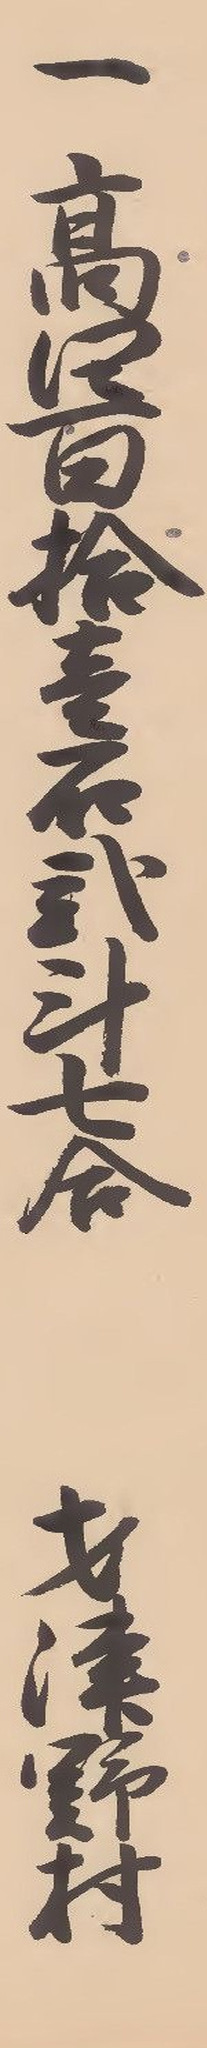一髙四百拾壱石弐斗七合才津野村
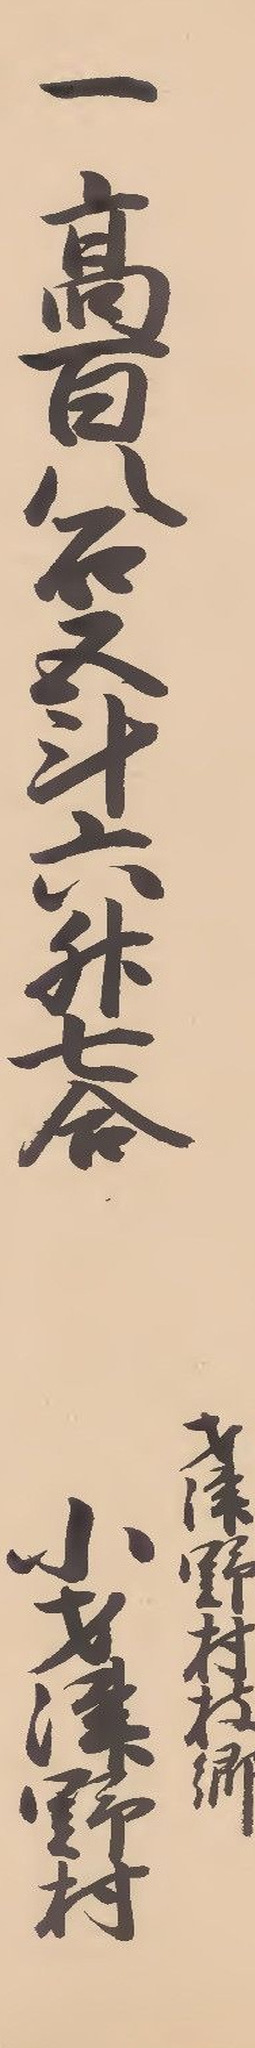一髙百八石五斗六升七合小才津野村
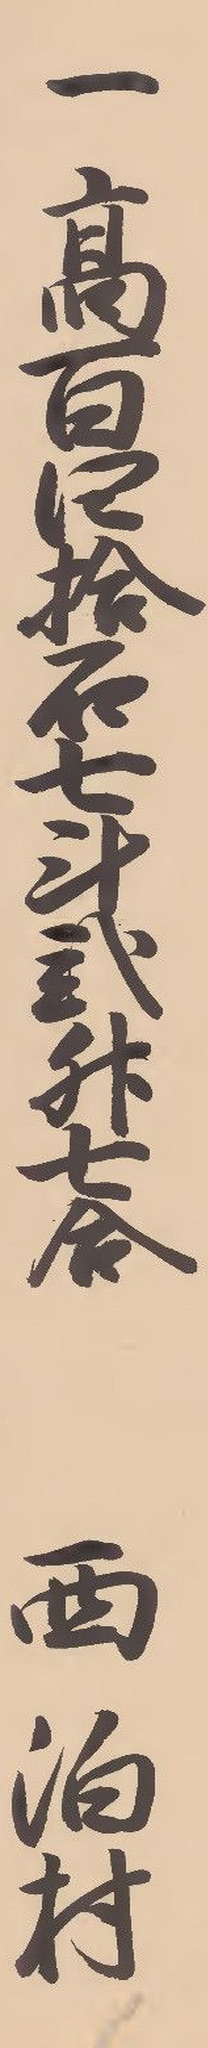一髙百四拾石七斗弐升七合西泊村
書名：土佐国郷帳
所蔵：国立公文書館 National Archives of Japan
